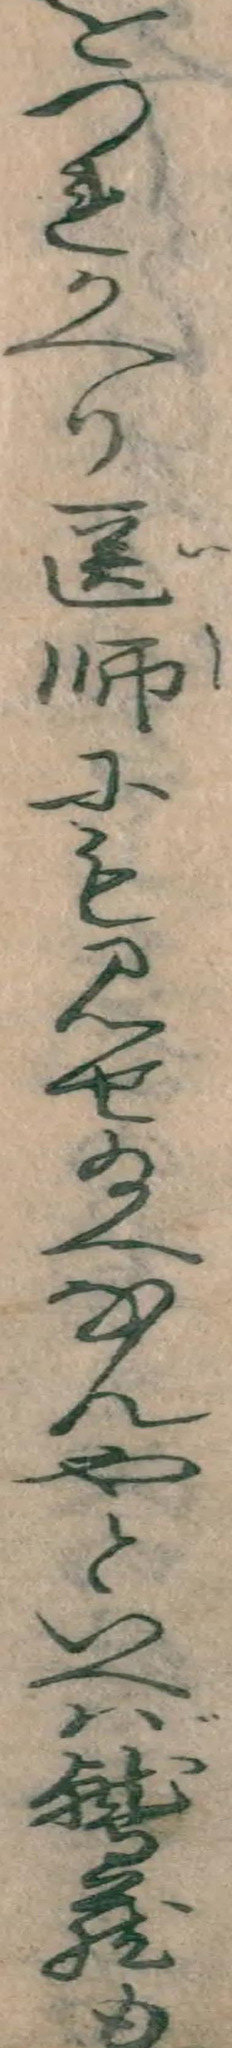をつれかへり医師にもみせ給へなんやといへば鷲蔵も
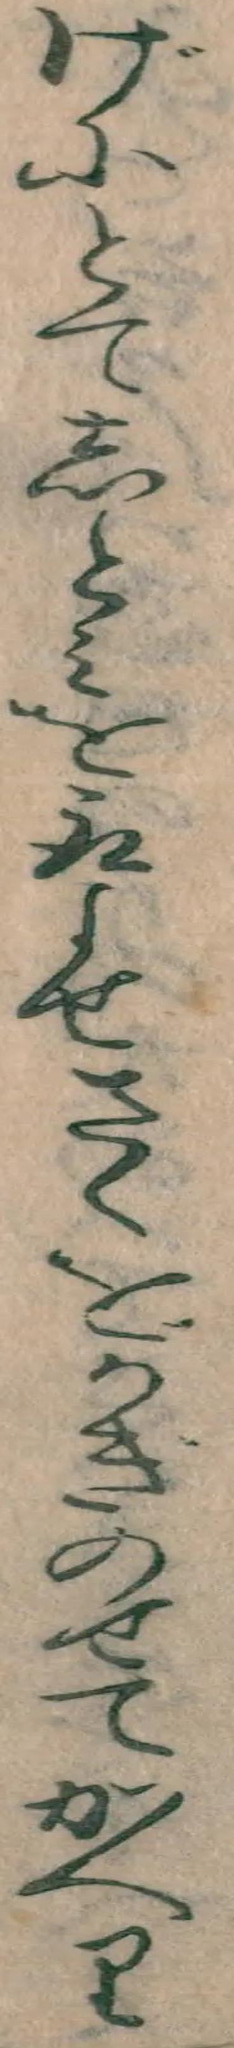げにとてしとみを取よせさくをかきのせてかへり
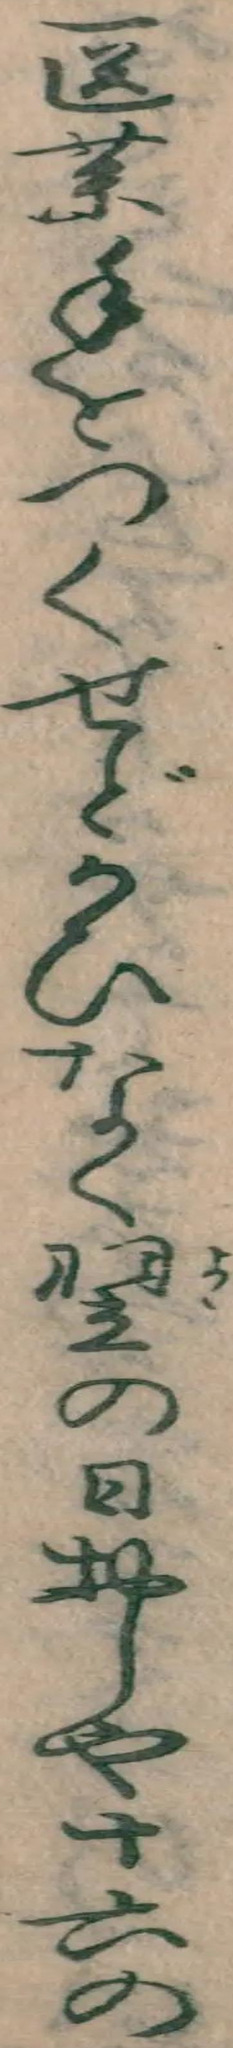医薬手をつくせどかひなく翌の日おしや十六の
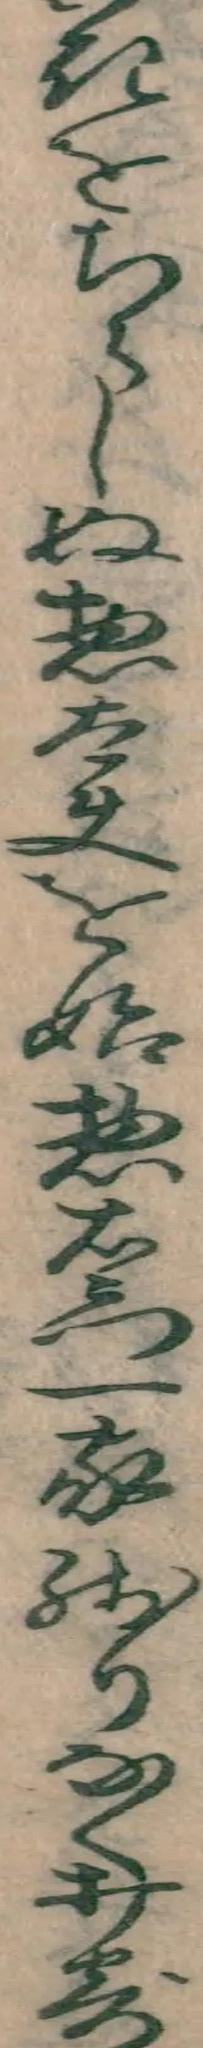花をちらしぬ惣太夫を始惣右衛門一家残りなく打寄
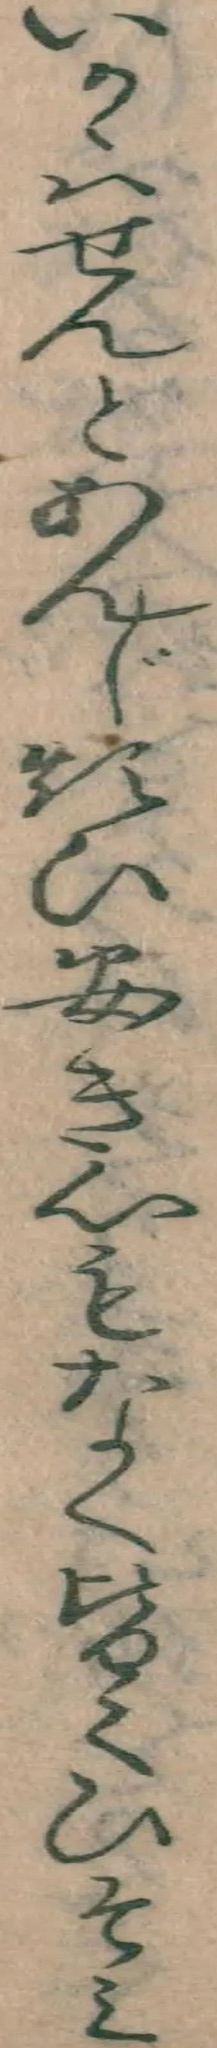いかゝはせんとあんじ煩ひ安き心もなく皆々ひそみ
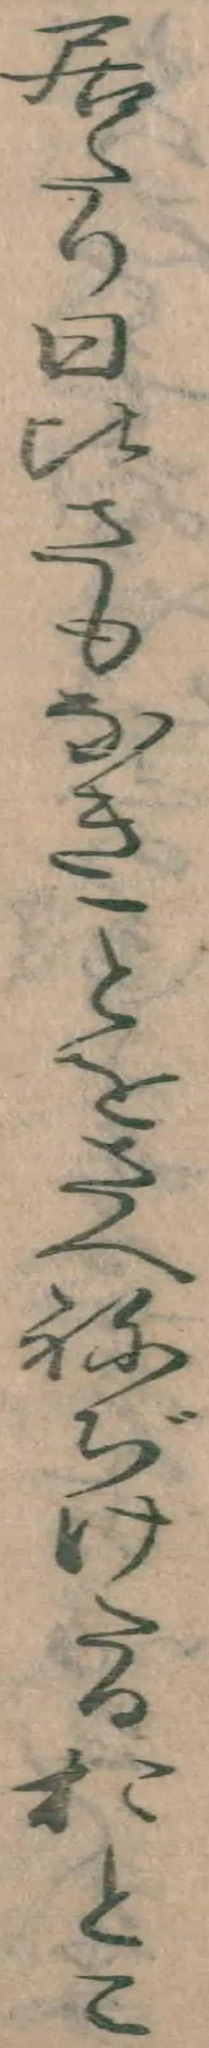居たり日頃さもなきことをさへねぢけたるおとこ
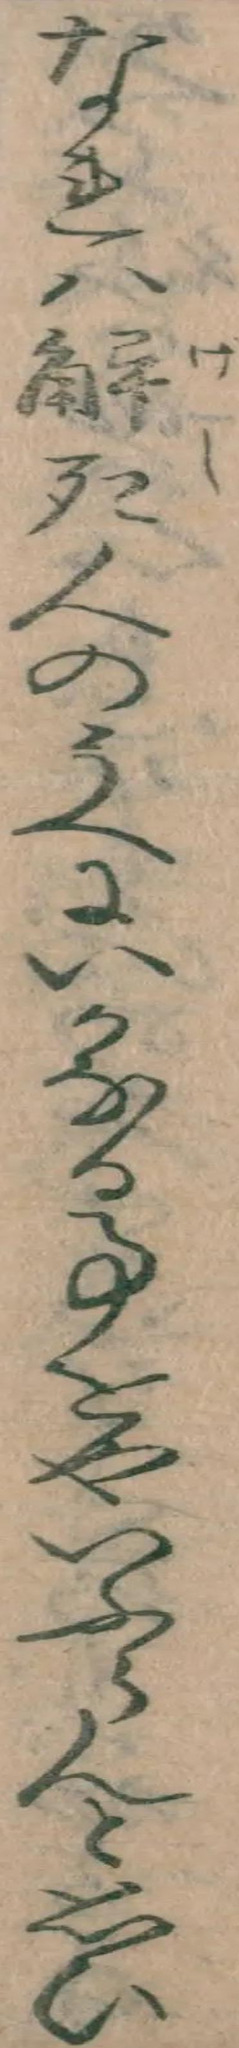なれは解死人のうへにいかなる事をやいふらんと思ひ
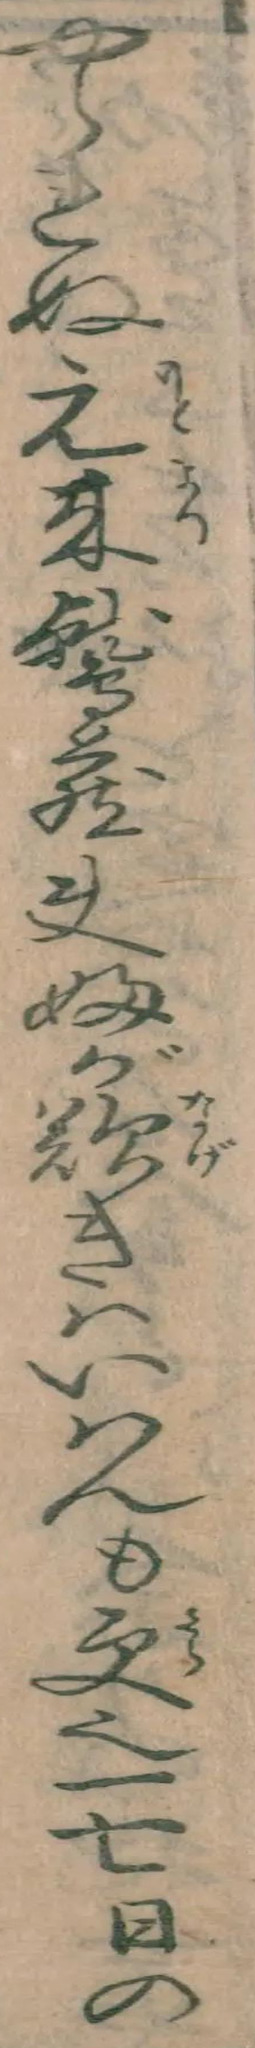やられぬ元来鷲蔵夫婦が歎きはいはんも更也一七日の
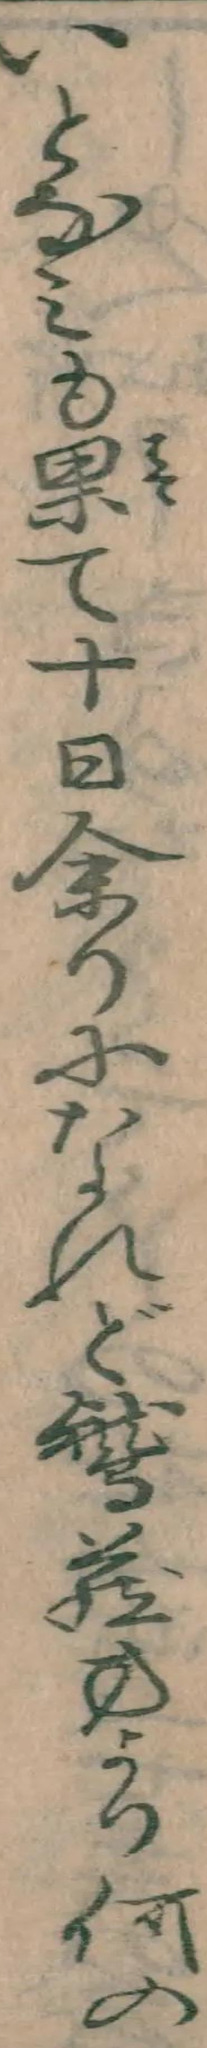いとなみも果て十日余りになれど鷲蔵方より何の
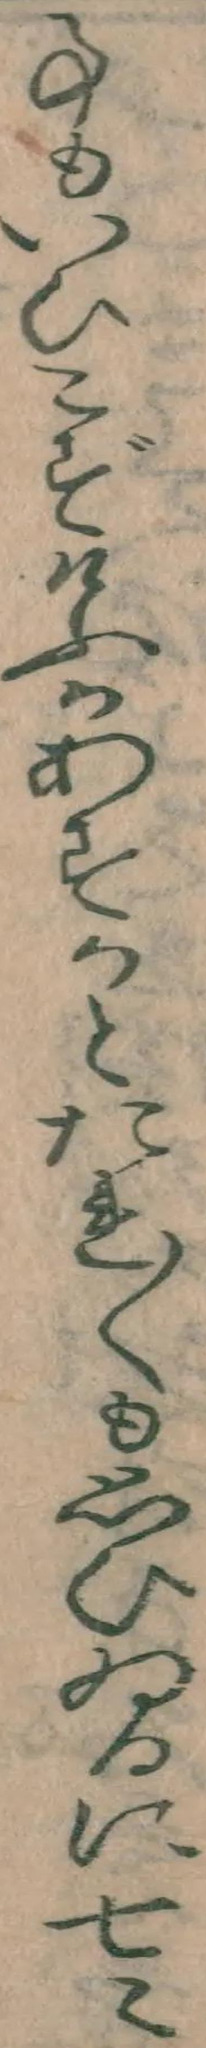事もいひこずけふかあすかとたれ〳〵も思ひゐるに七々
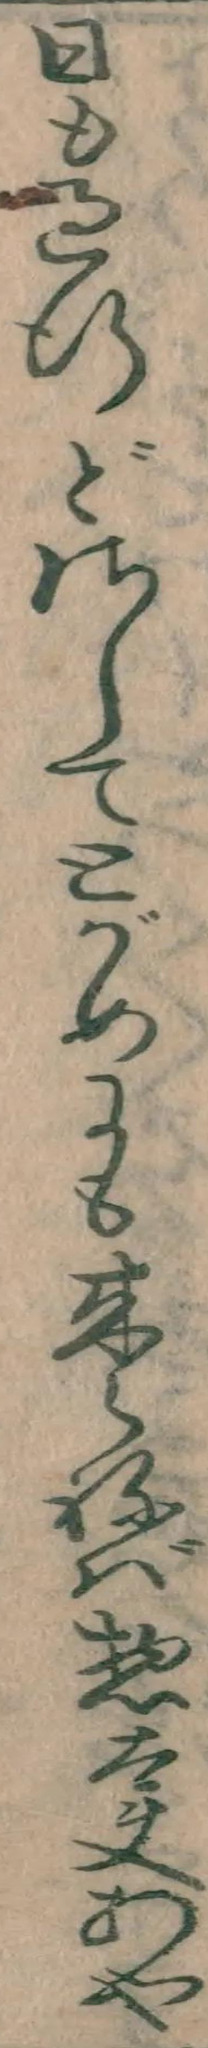日も過行どさしてとがめにも来らねば惣太夫あや
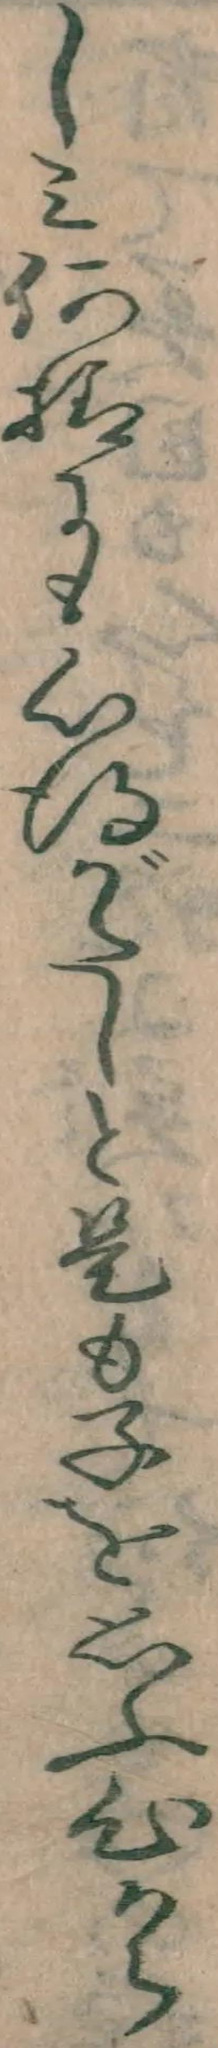しみ何様にも心得がたしと是も子を思ふ心から
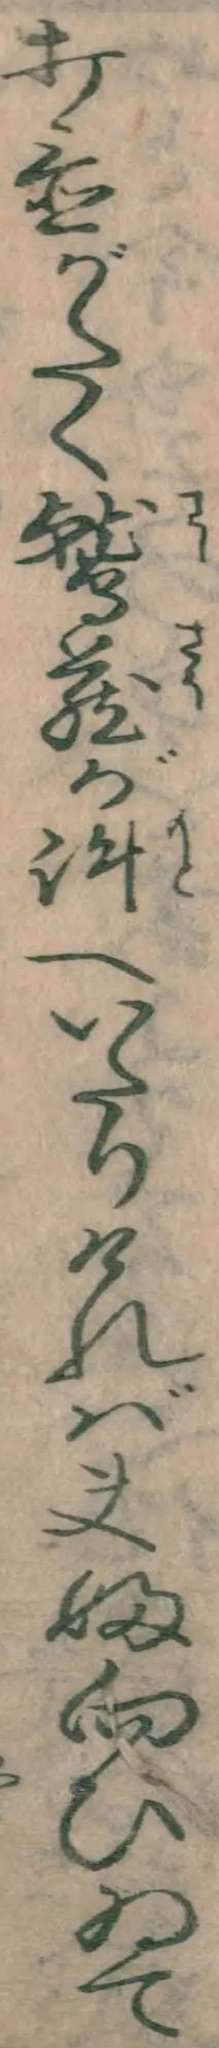打置がたく鷲蔵が許へいたりければ夫婦向ひゐて
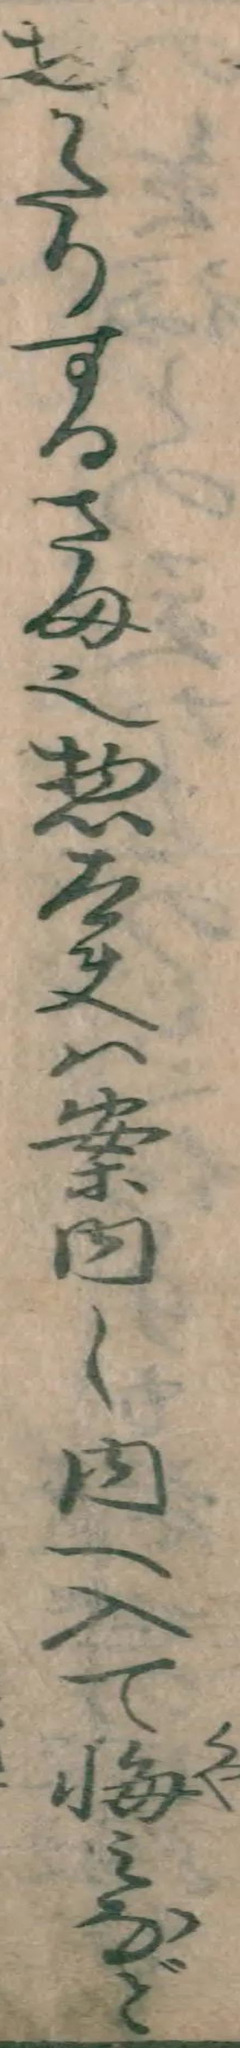物かたりするさま也惣太夫は案内し内へ入り悔みなど
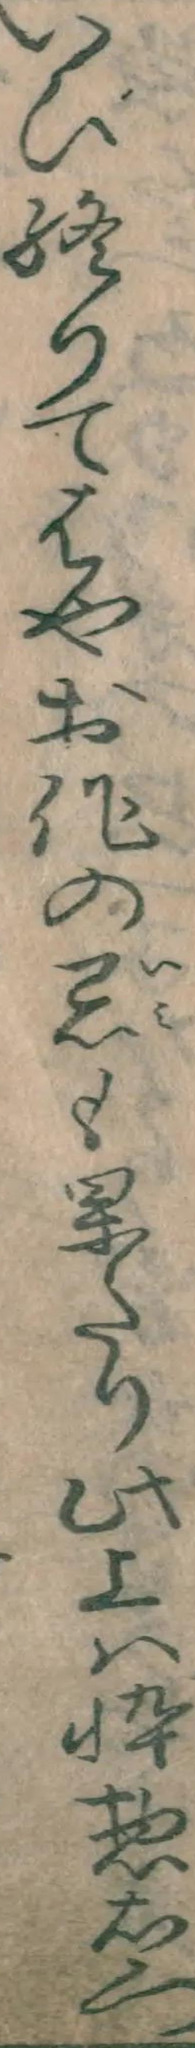いひ終りてはやお作の忌も果たり此上は忰惣右衛門
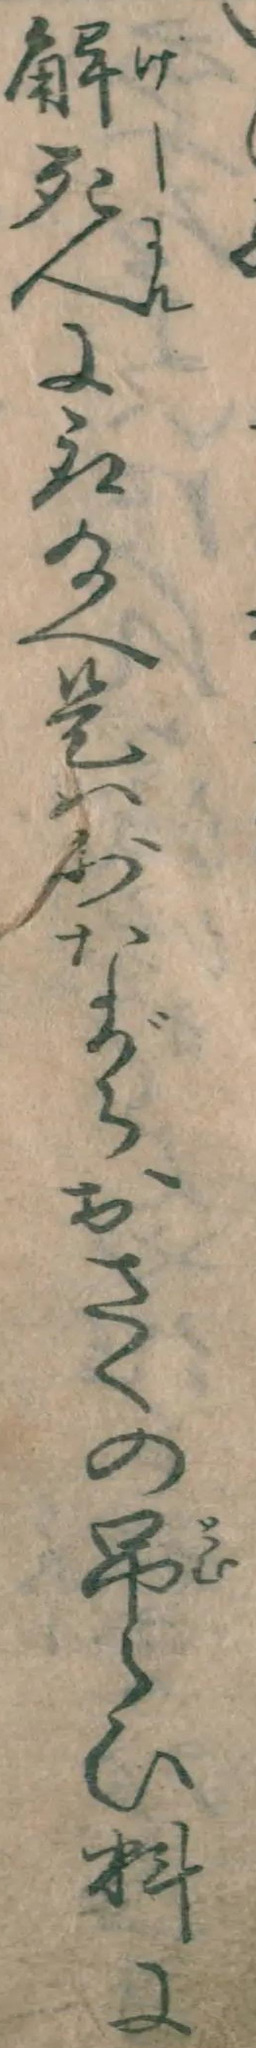解死人に取給へ是は少ながらおさくの弔らひ料に
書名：怪談御伽童 5巻. [1]
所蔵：国立国会図書館 National Diet Library, JAPAN
